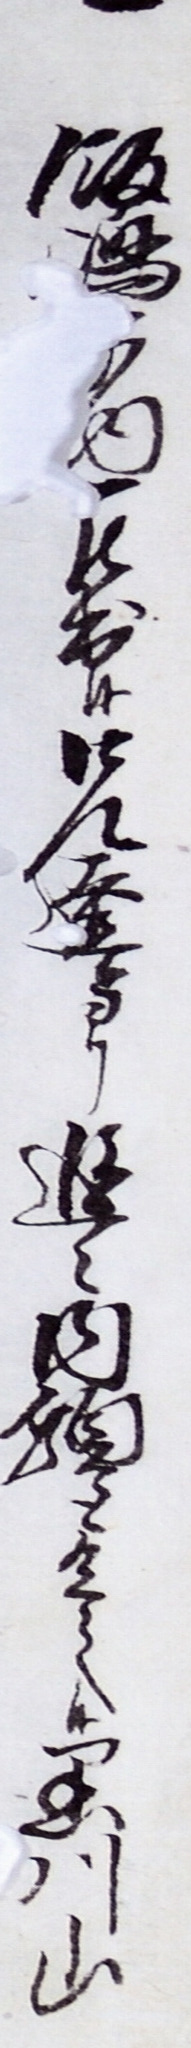一飯嶋罷出候先達より追々内願も有之候黒川山
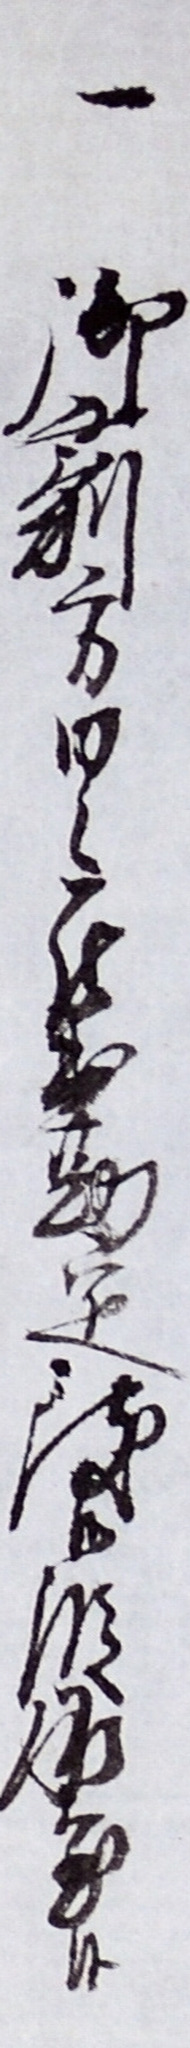御薪方日々罷出勘定致候段承置候
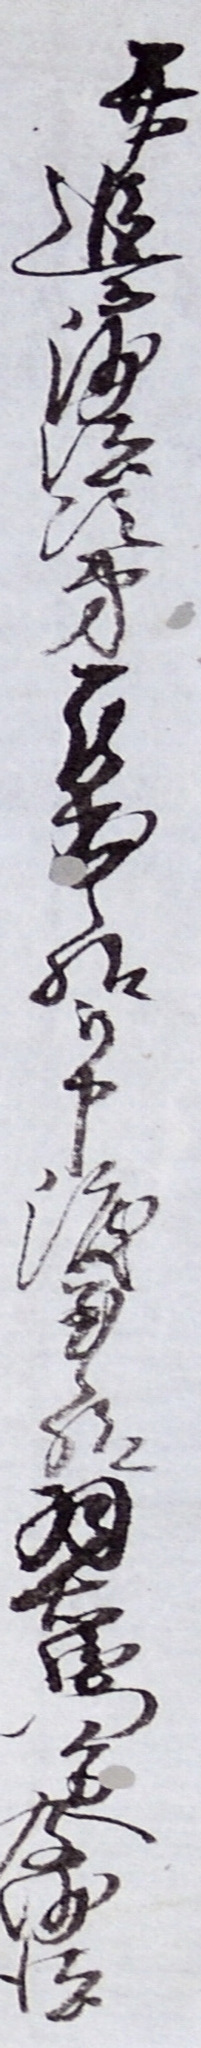并追而沙汰次第罷出候様被申渡置候様羽右衛門方へ及沙汰
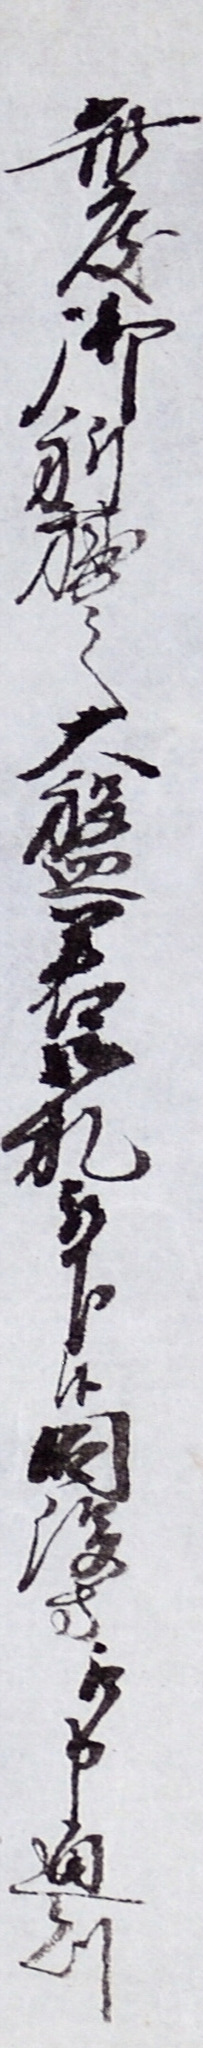一此度御祈祷之大盤差御札被下候同役方え申通則
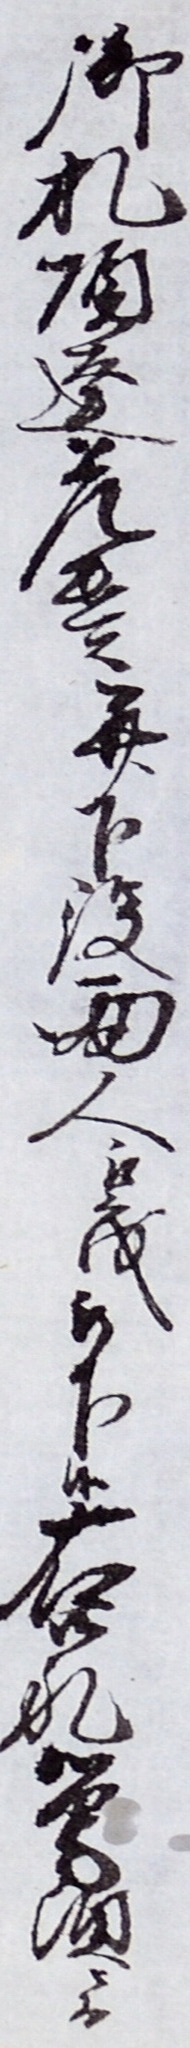御札頂達差遣候并下役両人えも被下候右御札方頭ニ而
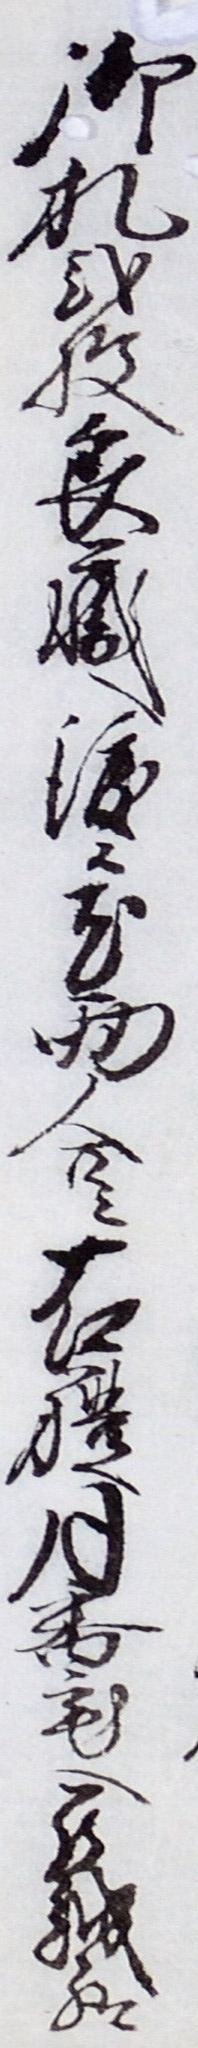御札弐枚裏職へ渡候尤両人共に右礼へ月番宅へ罷越候様
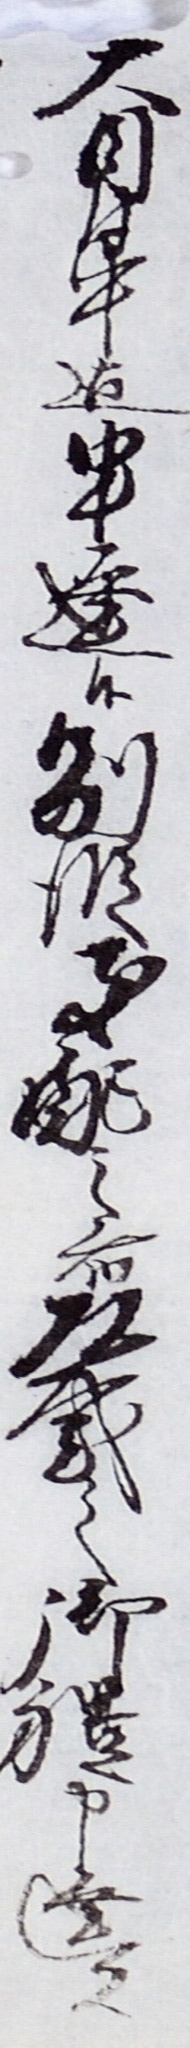大目付中迄申達候別段支配之者頂戴之御礼申達ス
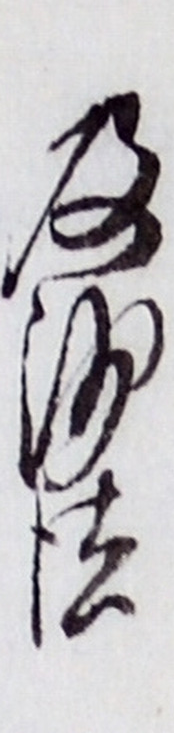及沙汰
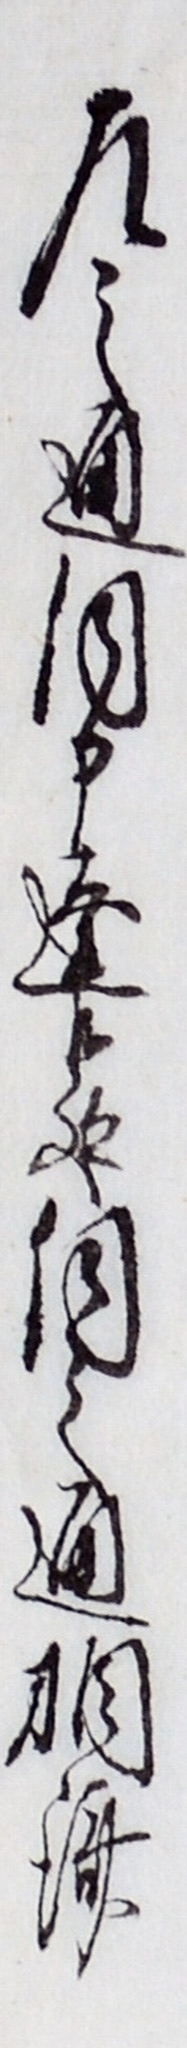一左之通伺申達候処伺之通相済
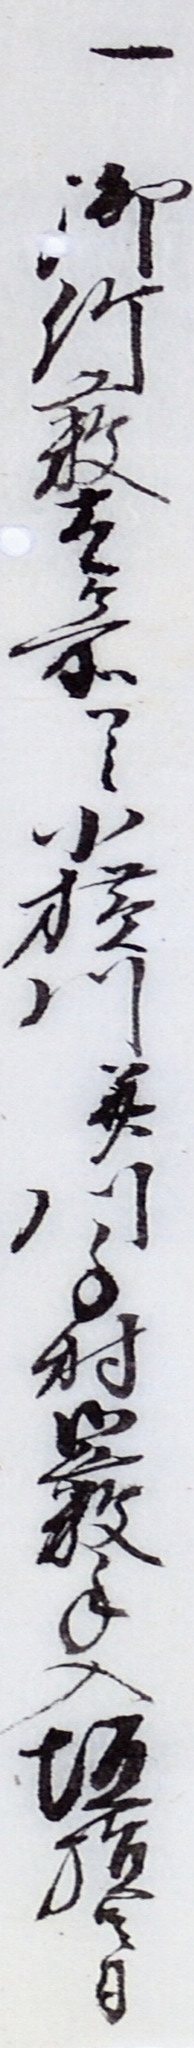一御竹藪壱ヶ所つヽ小横川并川手村御藪手入垣頂は日
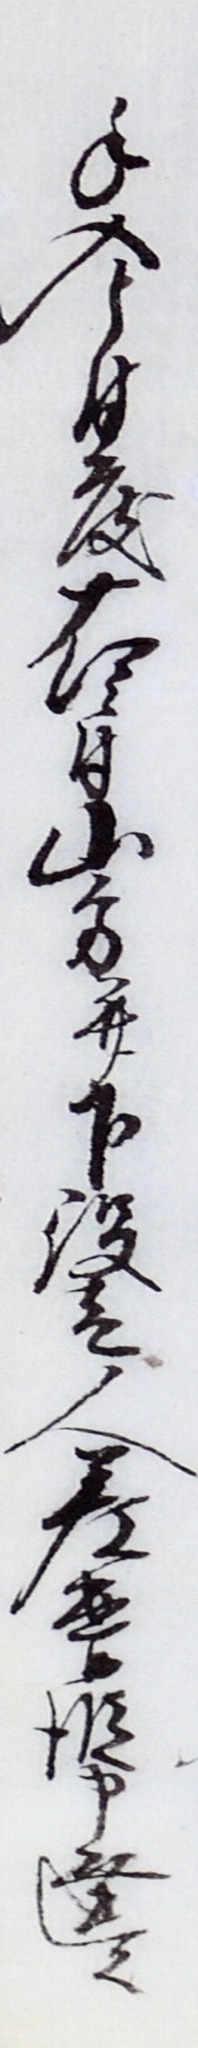手入申付度右ニ付山方并下役壱人差遣候段申達ス
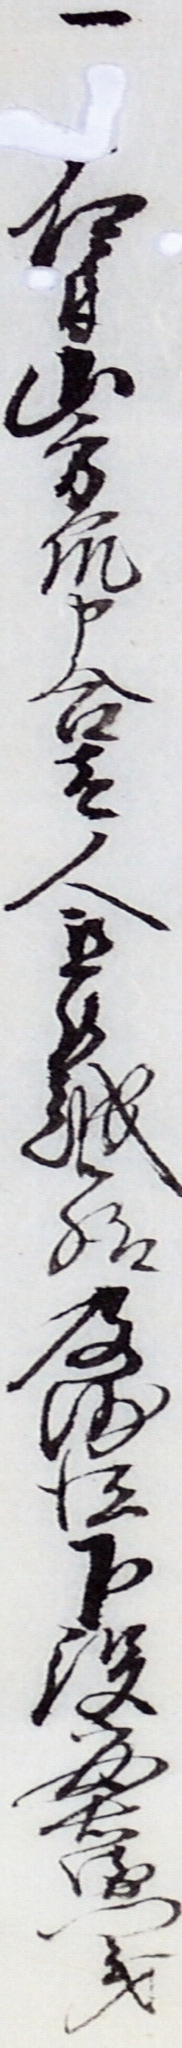一仰付山方衆申合壱人被罷越候様及沙汰下役安右衛門義
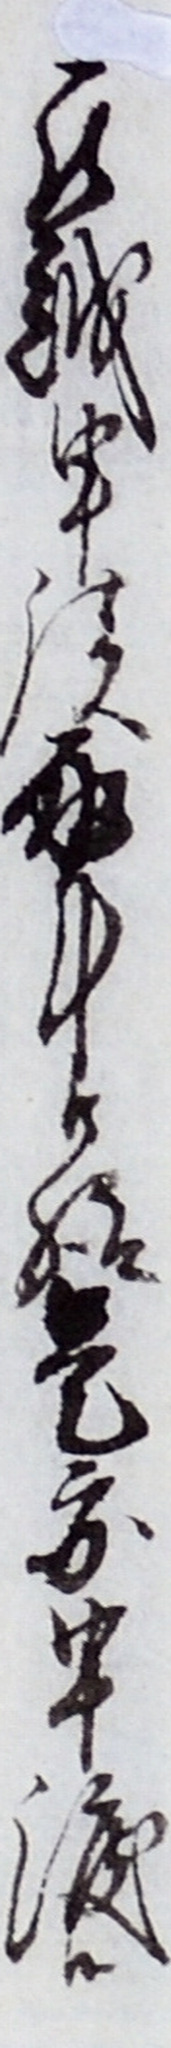罷越申談取計候様是亦申渡候
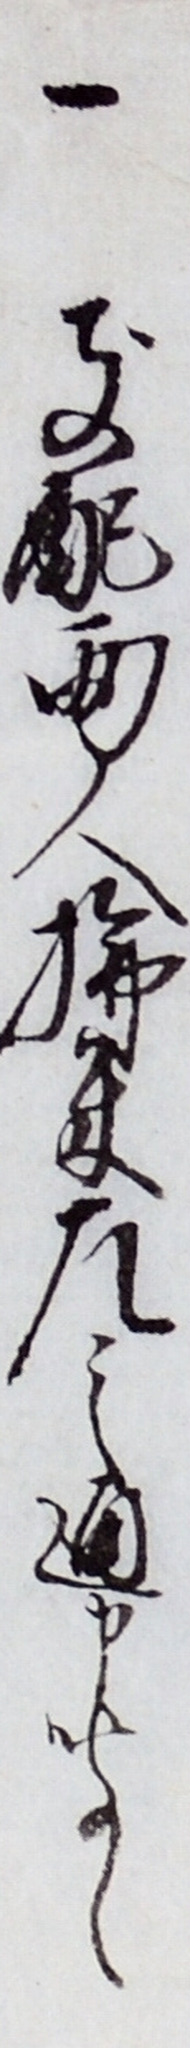一支配両人払米左之通申聞候
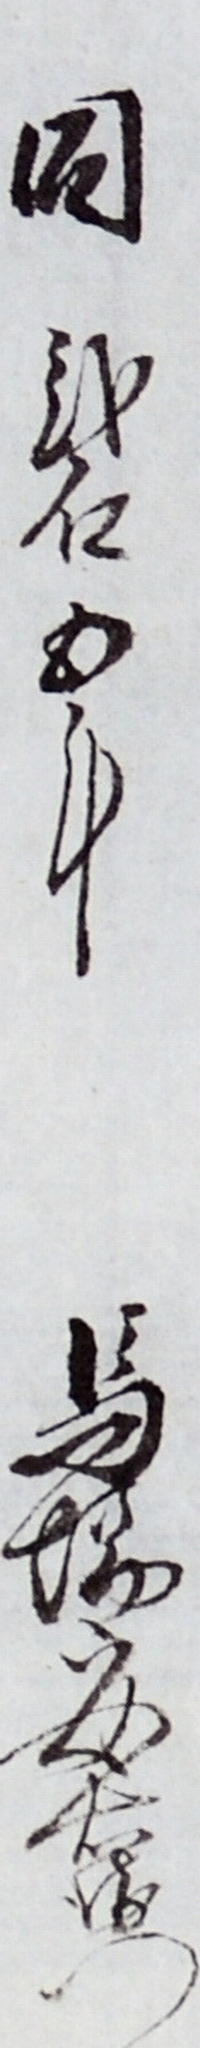同弐石五斗馬場安右衛門
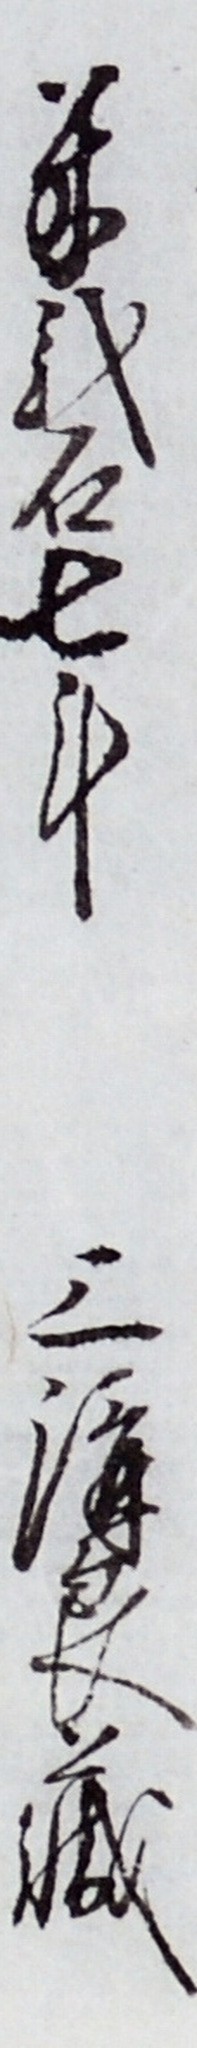米弐石七斗三溝良蔵
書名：御山奉行御用控
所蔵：伊那市立高遠町図書館・合同会社AMANE
